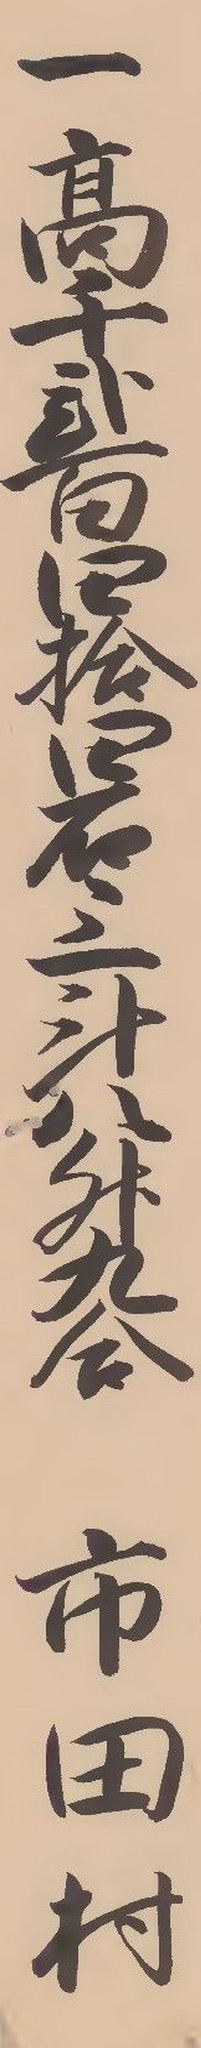一高千弐百四拾四石三斗八升九合市田村

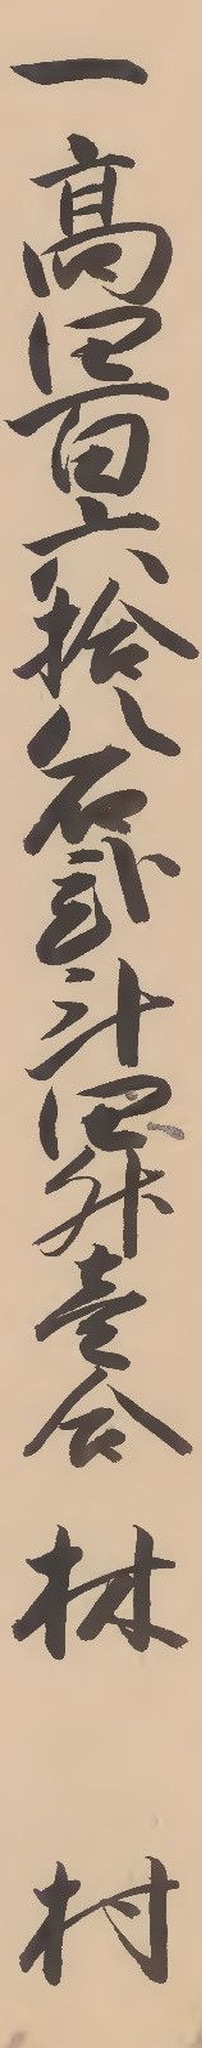一高四百六拾八石弐斗四升壱合林村
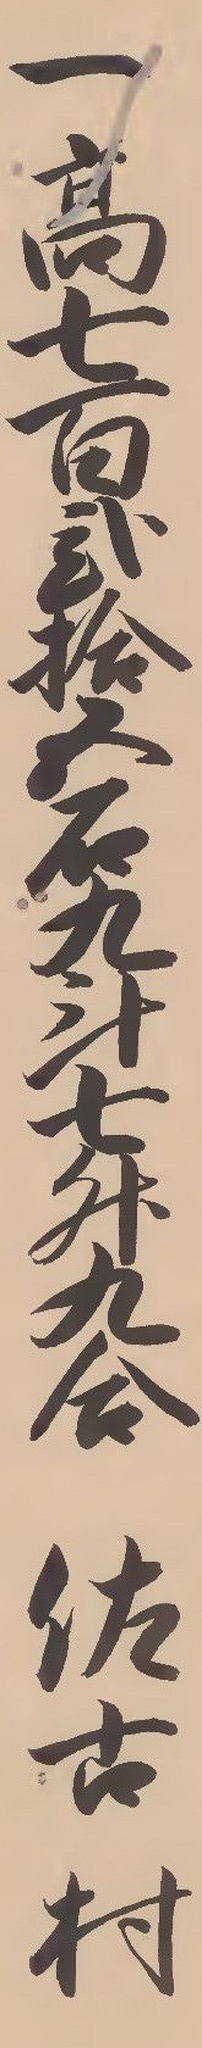一高七百弐拾五石九斗七升九合佐古村
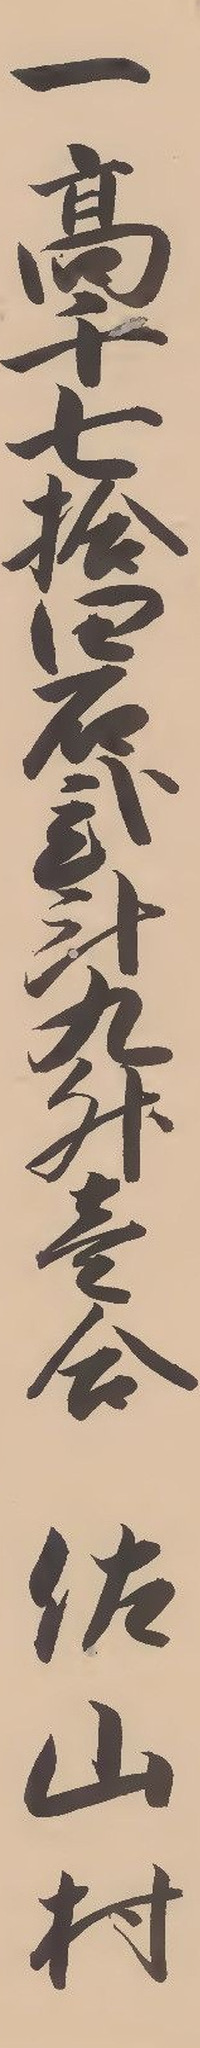一高千七拾四石弐斗九升壱合佐山村
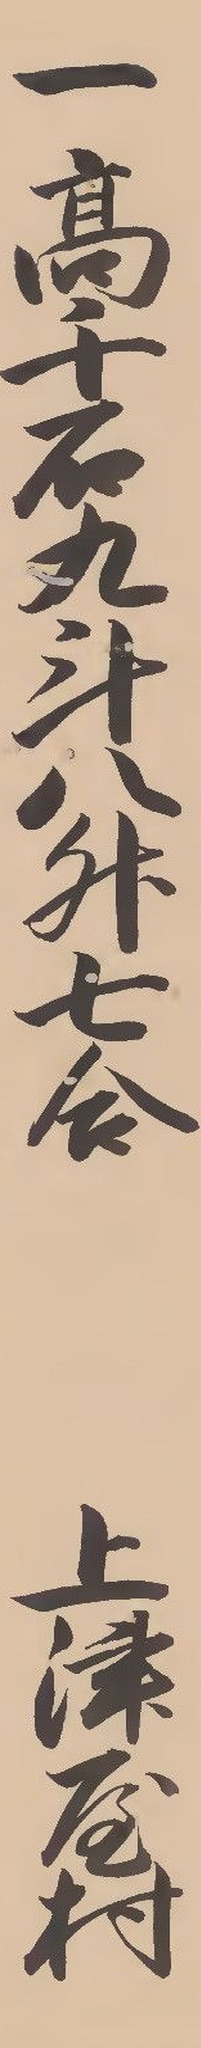一高千石九斗八升七合上津屋村
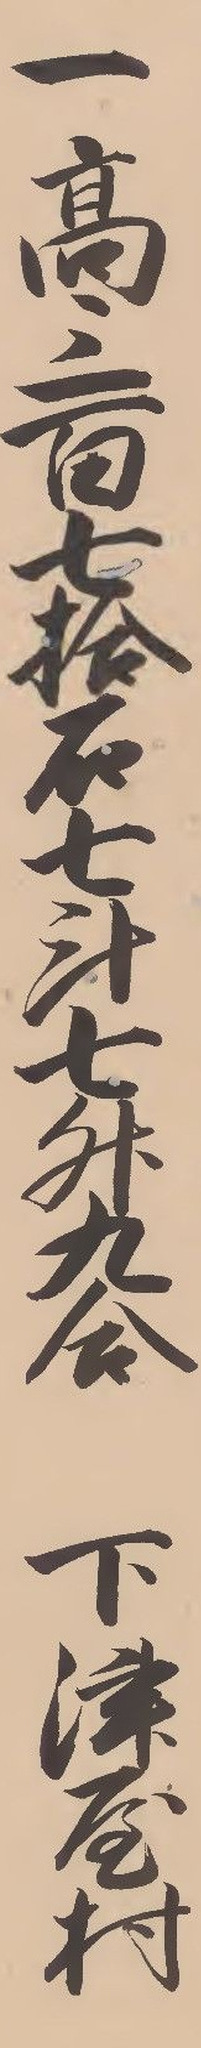一高三百七拾石七斗七升九合下津屋村
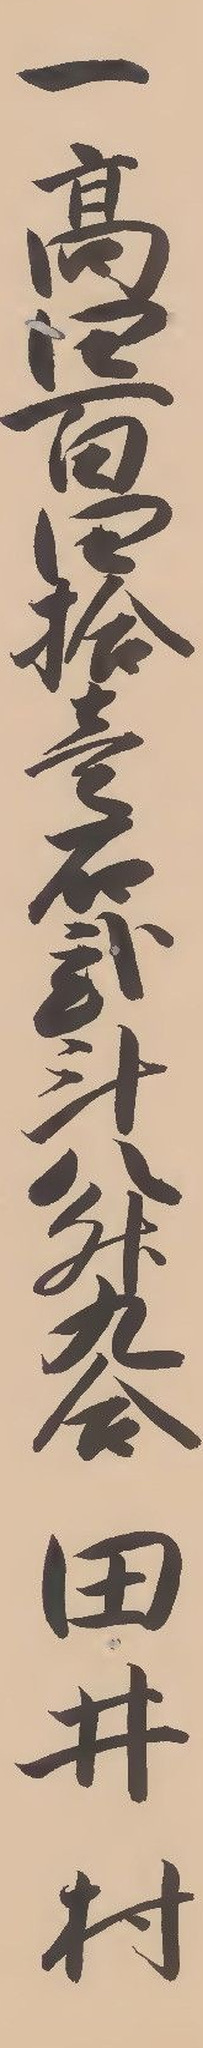一高四百四拾壱石弐斗八升九合田井村
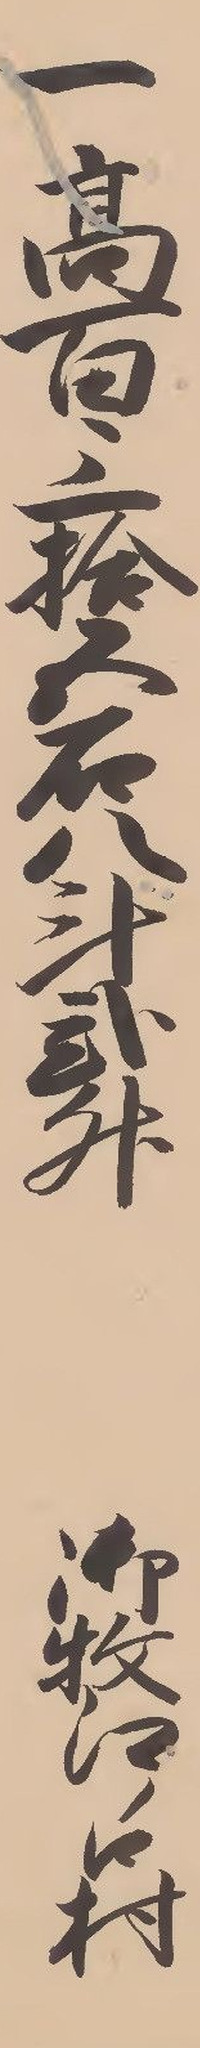一高百三拾五石八斗弐升御牧江ノ口村
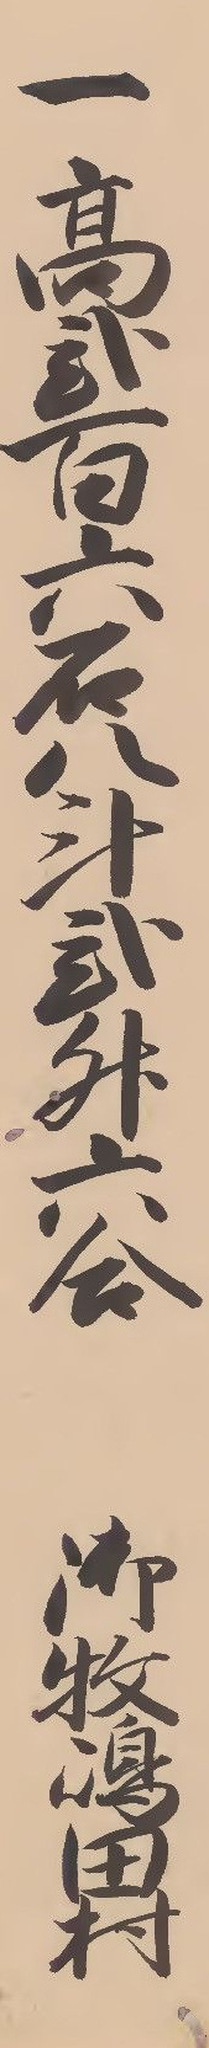一高弐百六石八斗弐升六合御牧嶋田村

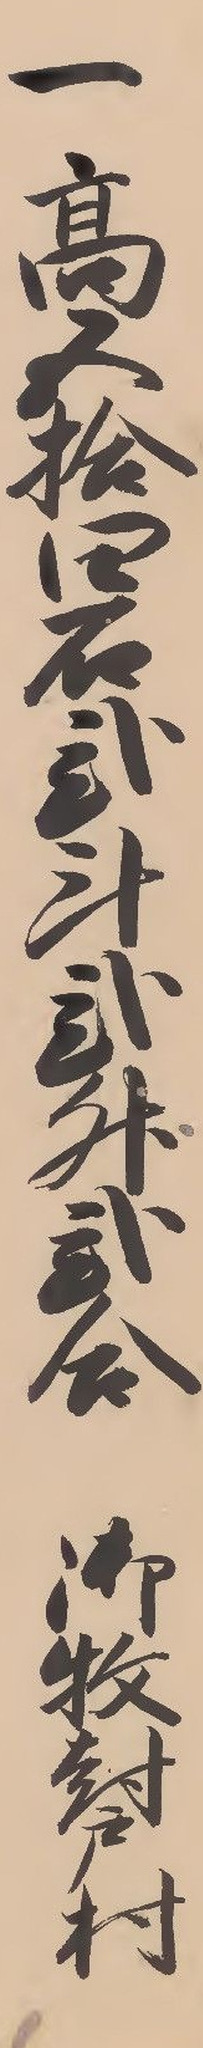一高五拾四石弐斗弐升弐合御牧封戸村
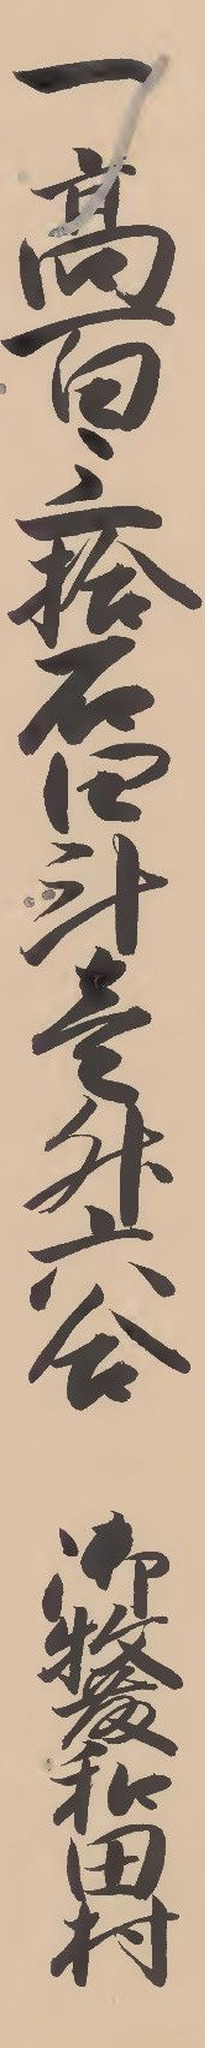一高百三拾石四斗壱升六合御牧藤和田村
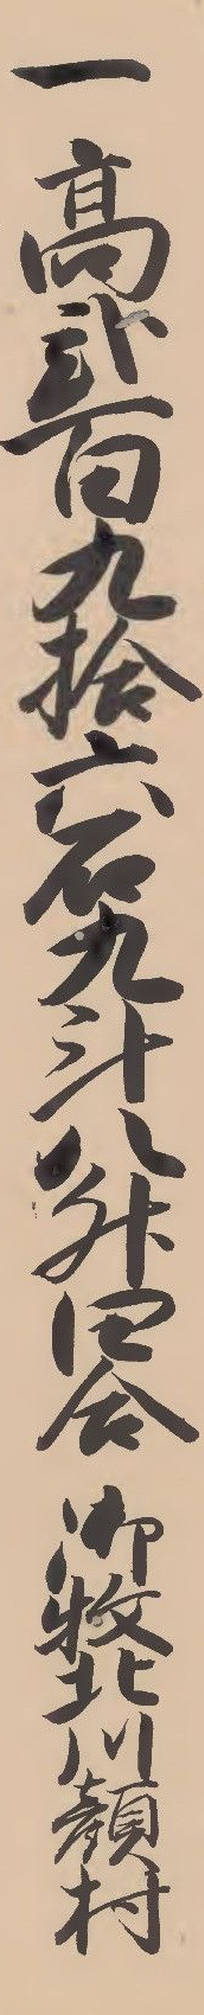一高弐百九拾六石九斗八升四合御牧北川顔村
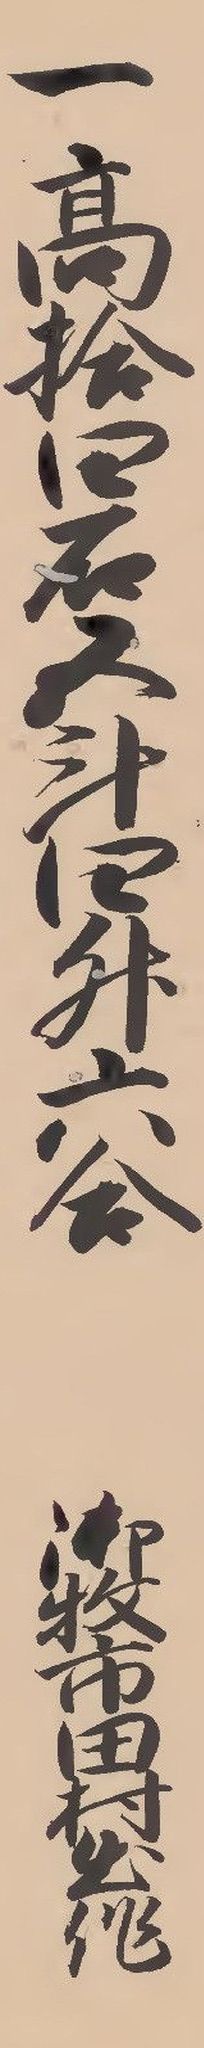一高拾四石五斗四升六合御牧市田村出作
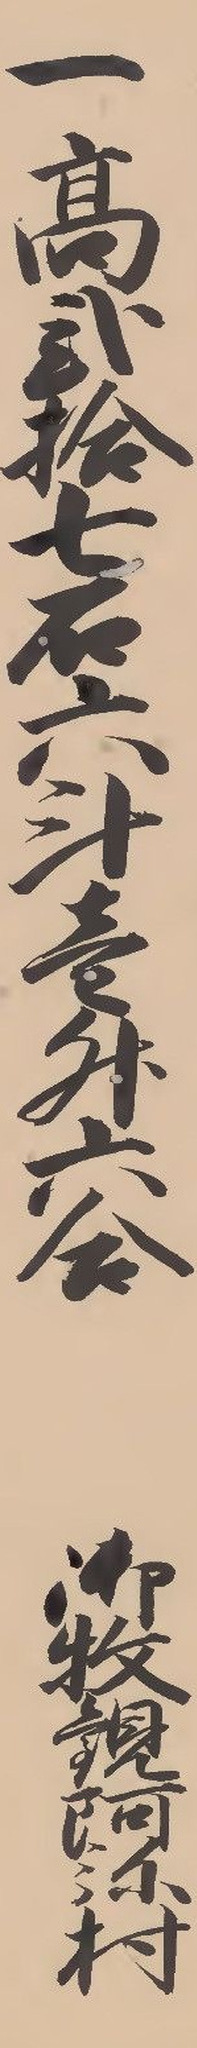一高弐拾七石六斗壱升六合御牧観阿弥村
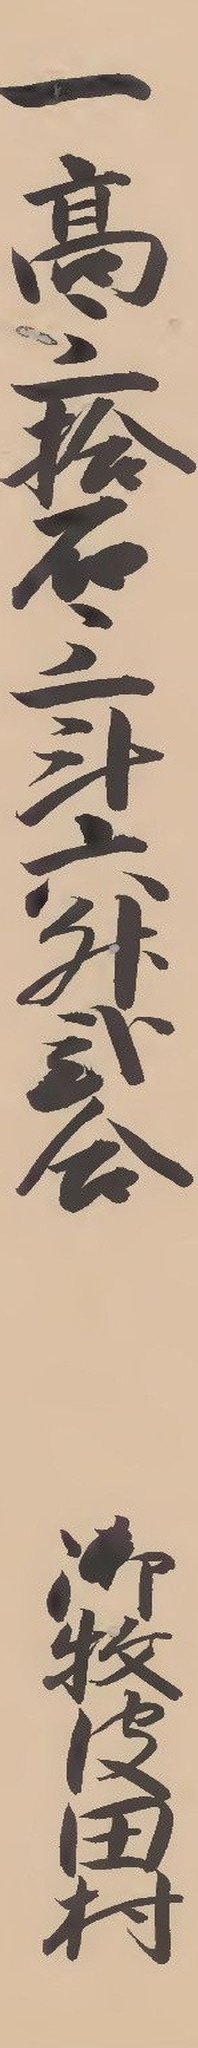一高三拾石三斗六升弐合御牧皮田村
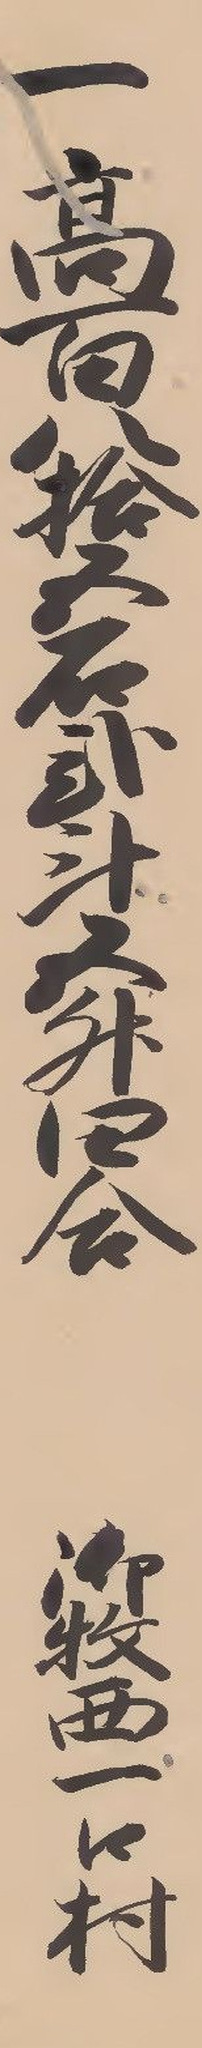一高百八拾五石弐斗五升四合御牧西一口村
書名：山城国郷帳
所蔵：国立公文書館 National Archives of Japan
